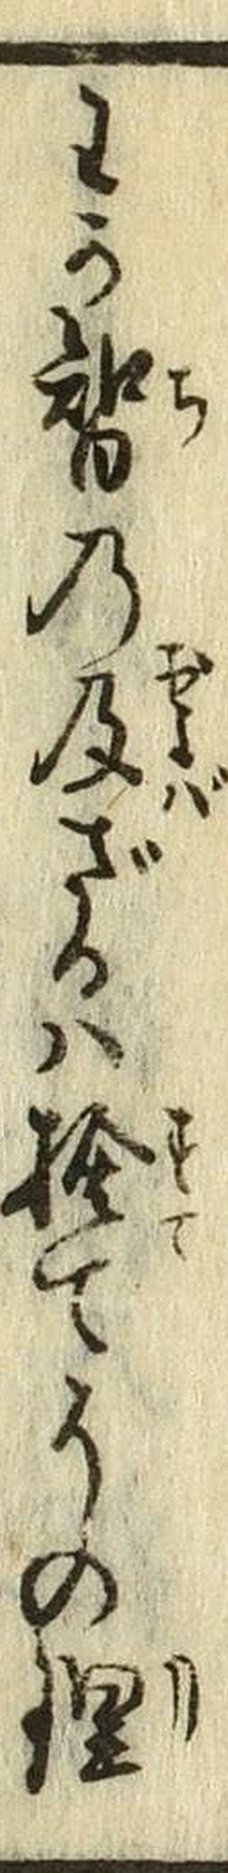わか智の及ざるは捨てその理
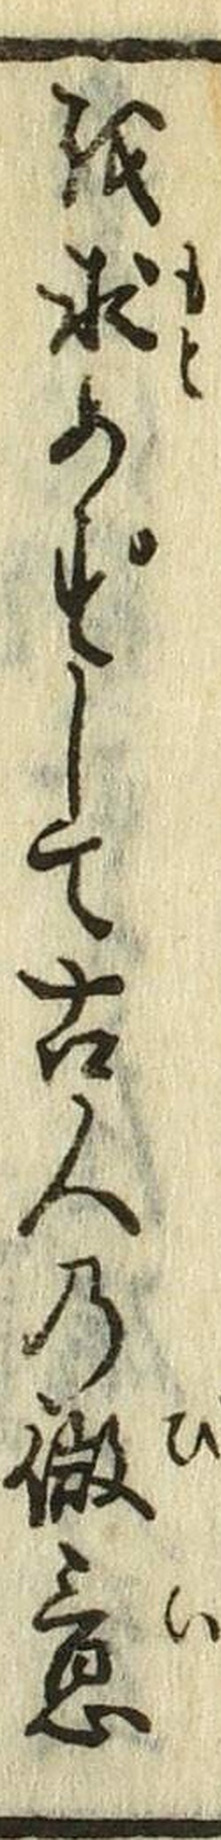を求めずして古人の微意
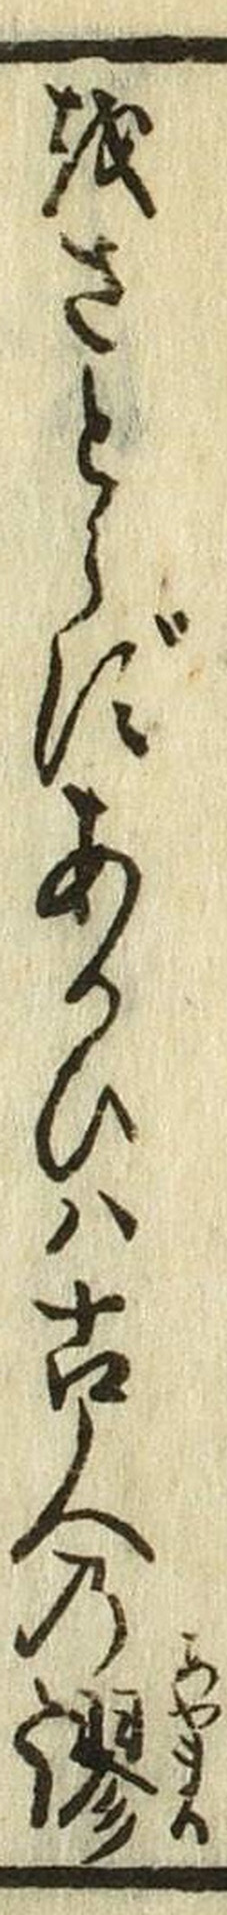をさとらずあるひは古人の謬
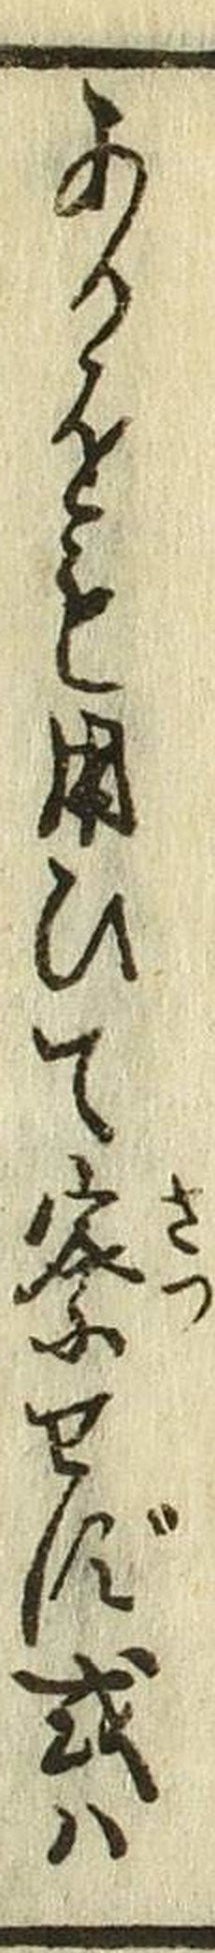あるをも用ひて察せず或は
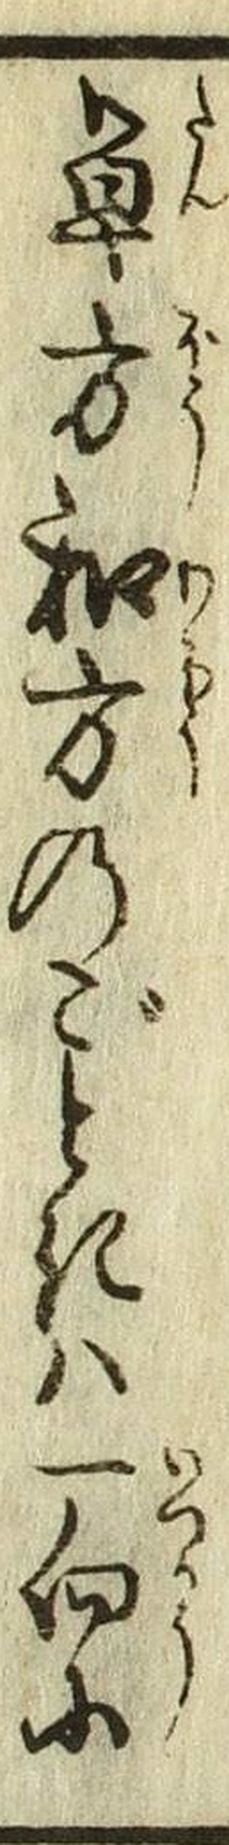単方和方のごときは一向に
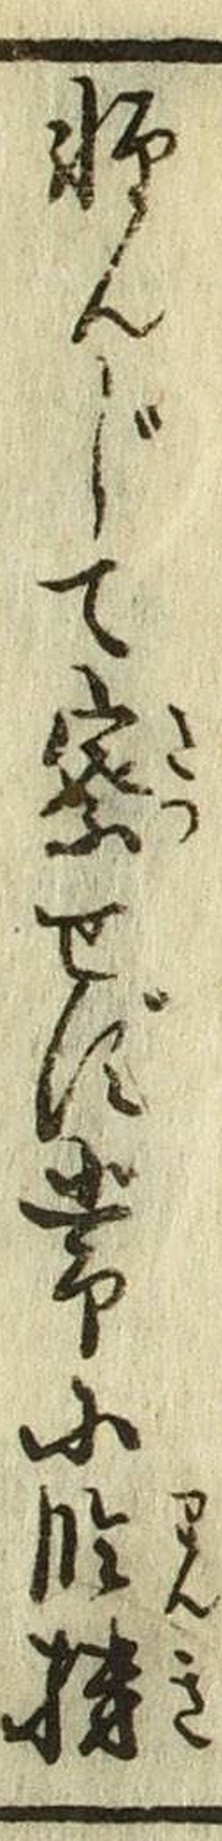軽んじて察せず常に臨機
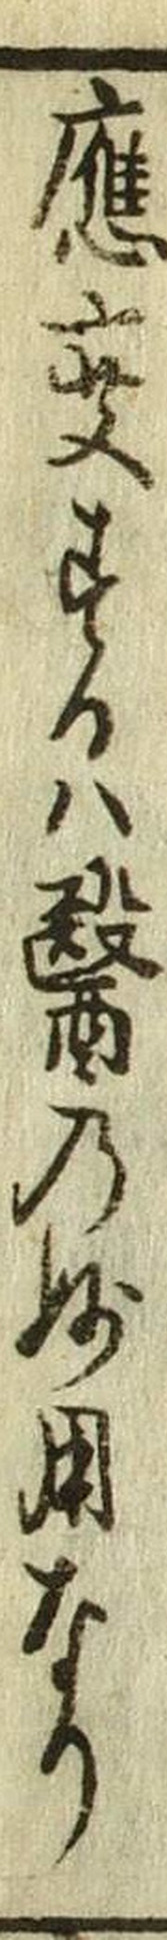応変するは医の妙用なり
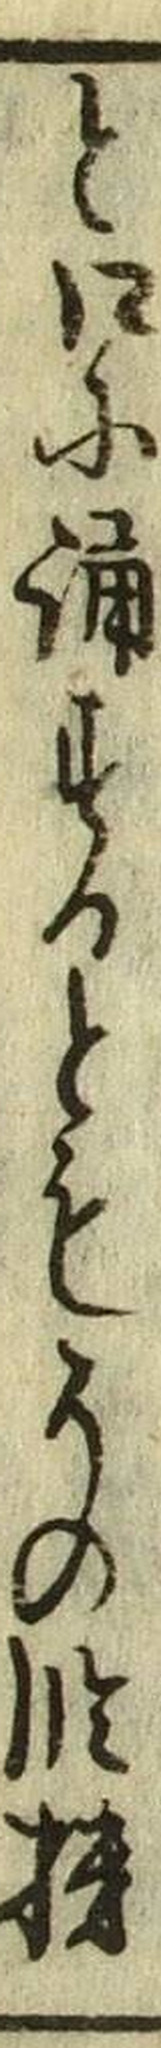と口に誦するともその臨機

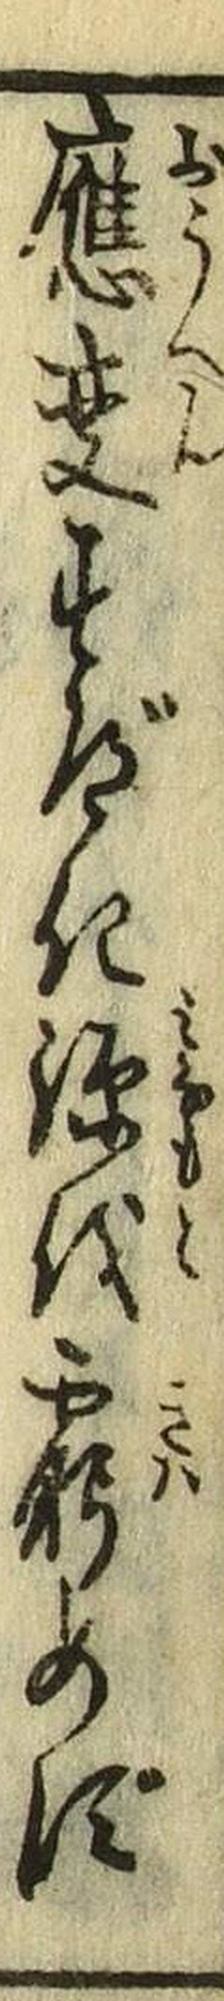応変すべき源を窮めず
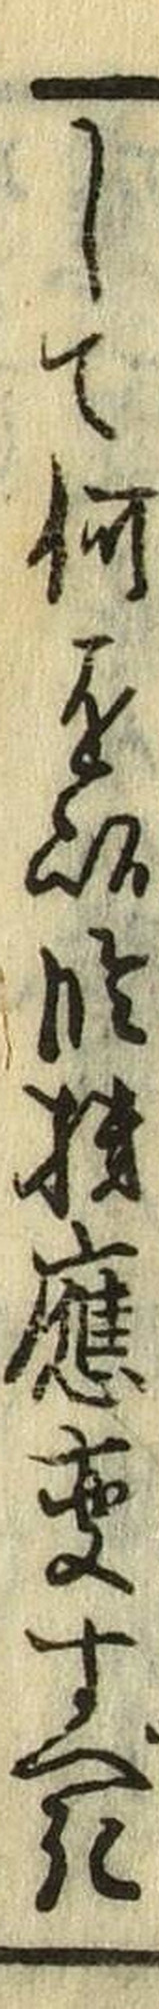して何を以臨機応変すべき
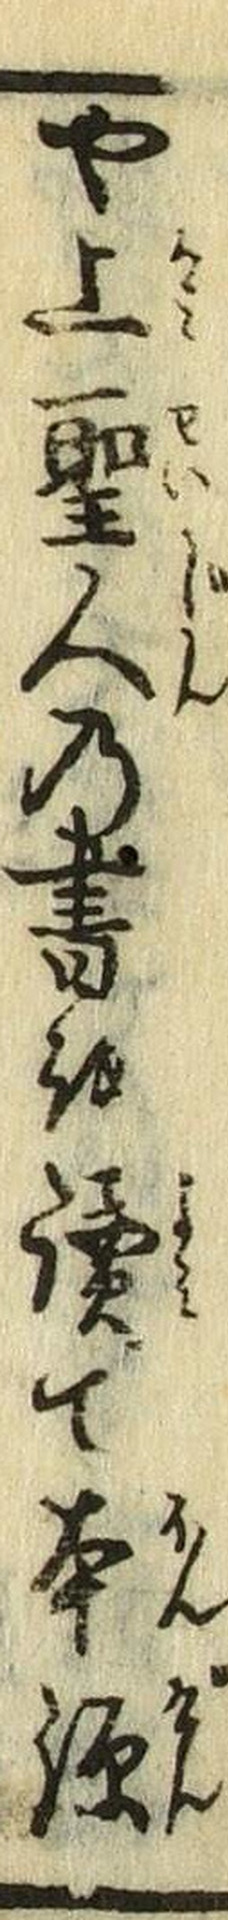や上聖人の書を読て本源
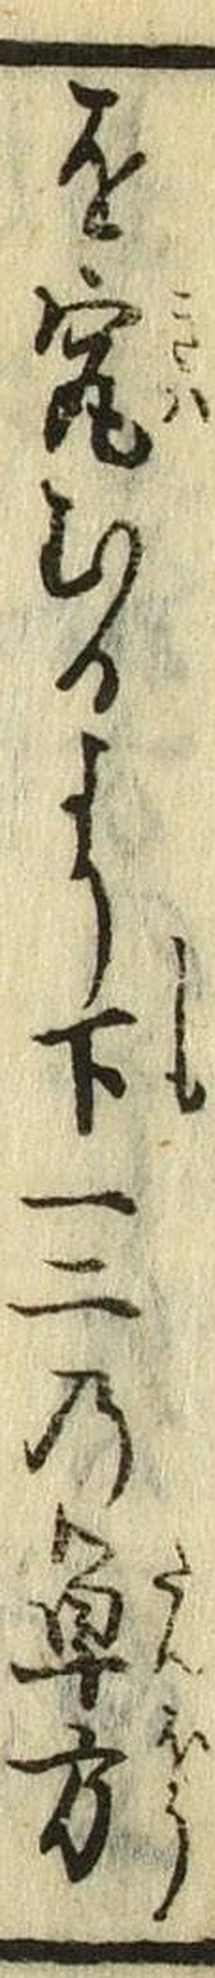を究むるより下一二の単方
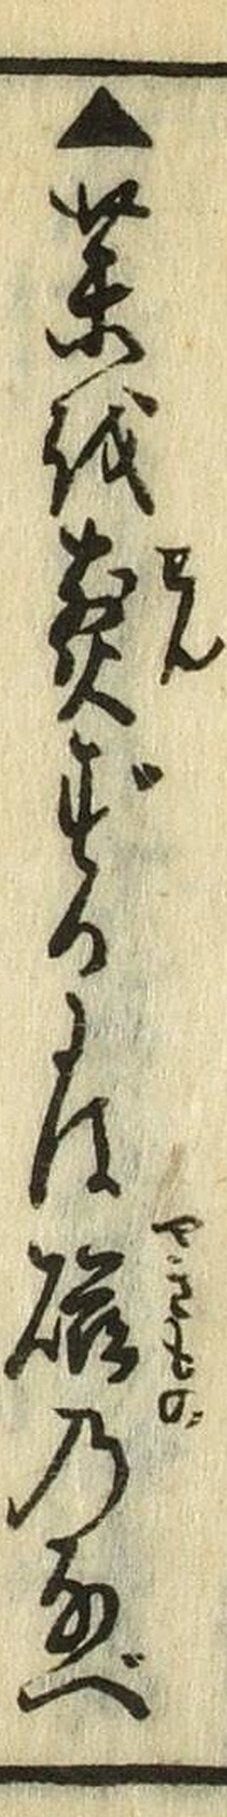▲薬を煎ずるには磁のなべ
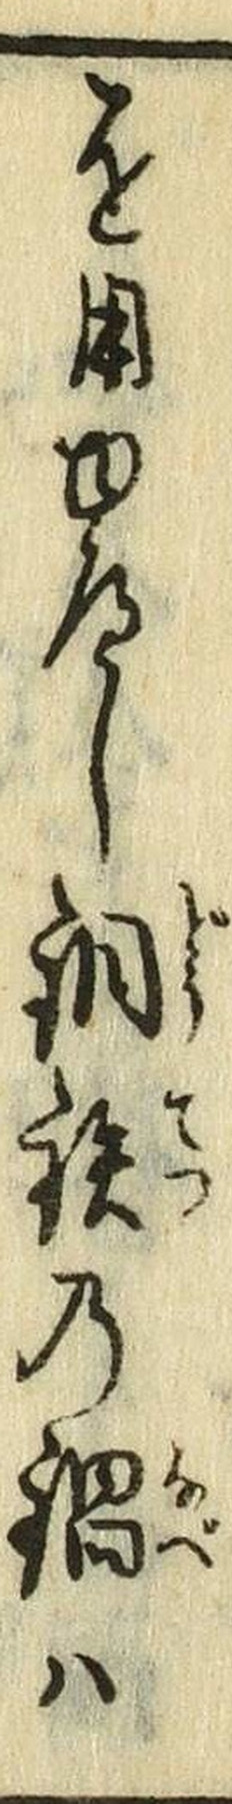を用ゆへし銅鉄の鍋は
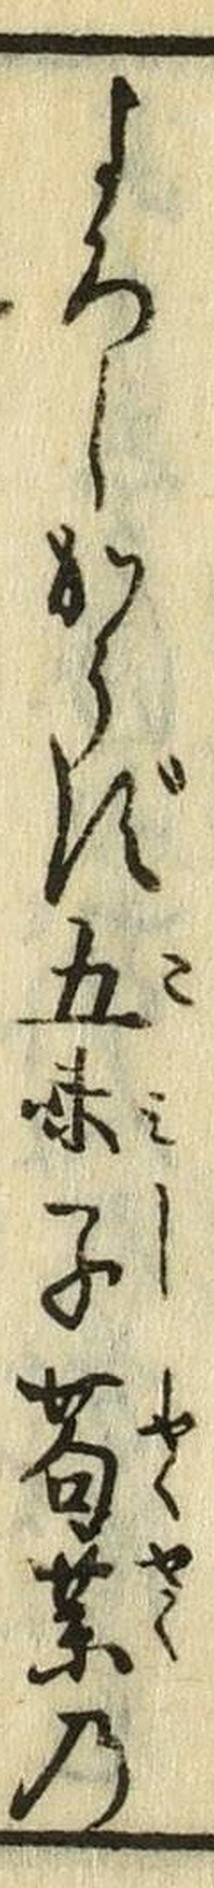よろしからず五味子芍薬の
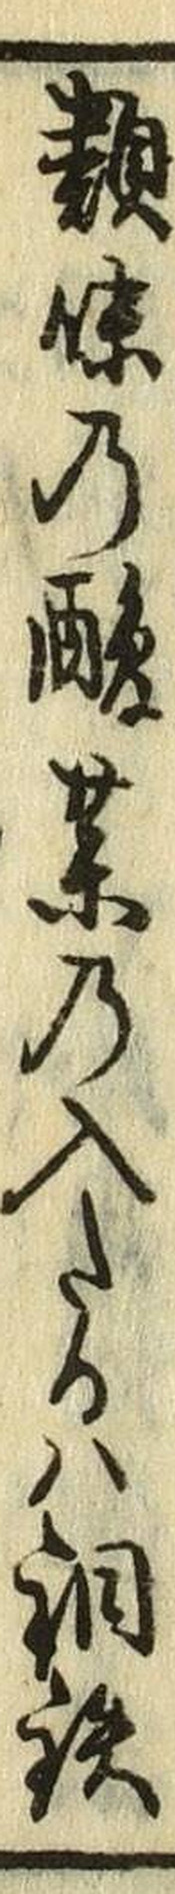類味の酸薬の入たるは銅鉄
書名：居家養生記
